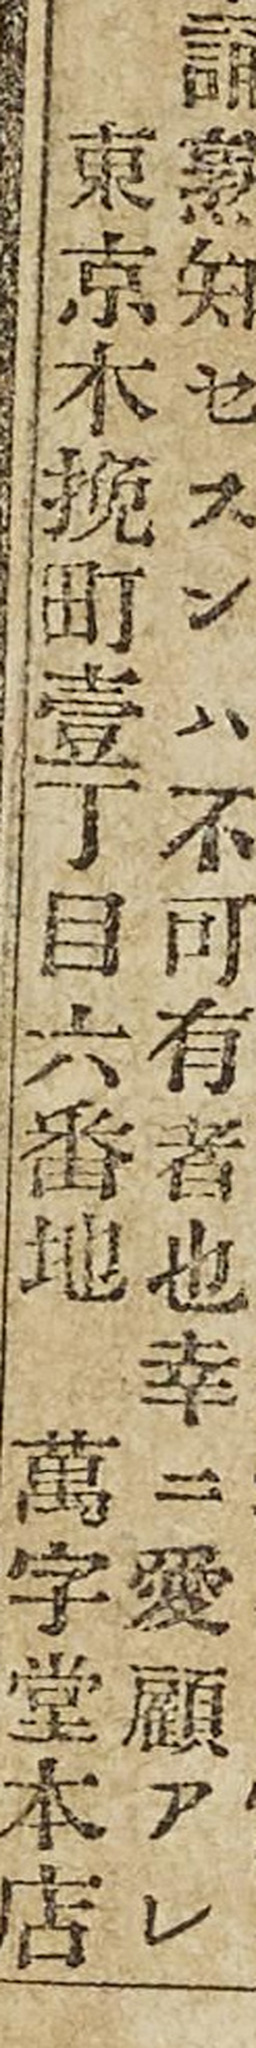東京木挽町一丁目六番地萬字堂本店
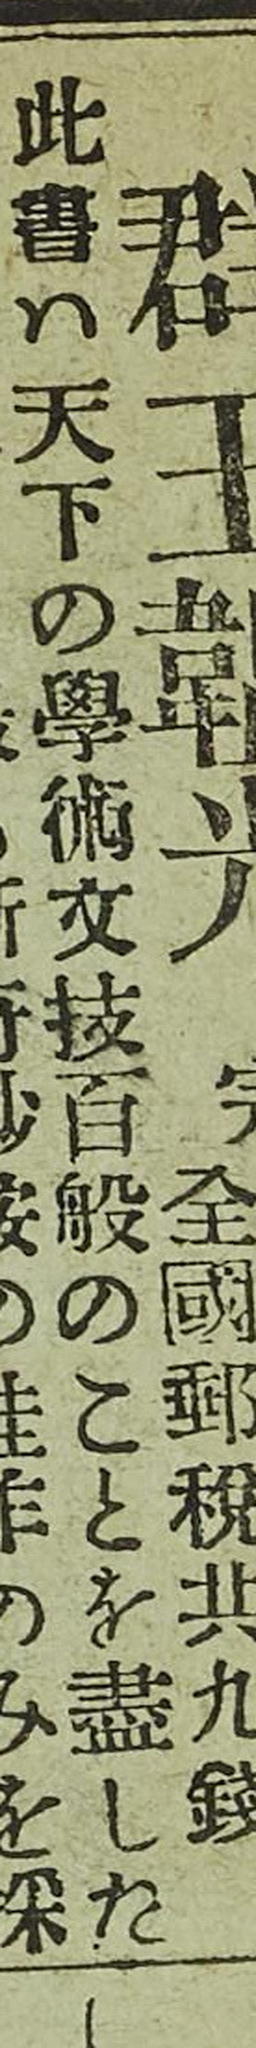此書は天下の学術文枝百般のことを尽した
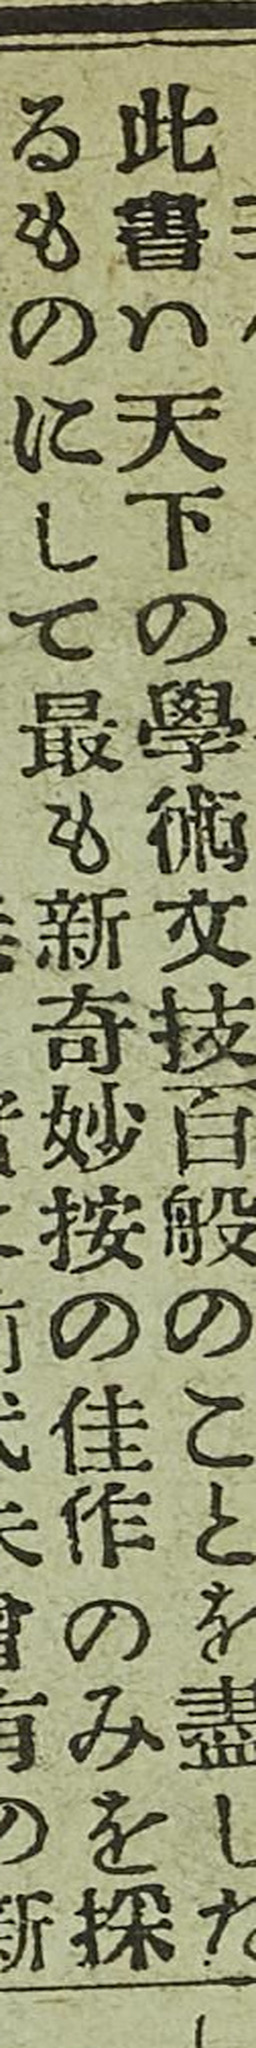るものにして最も新奇妙按の佳作のみを採
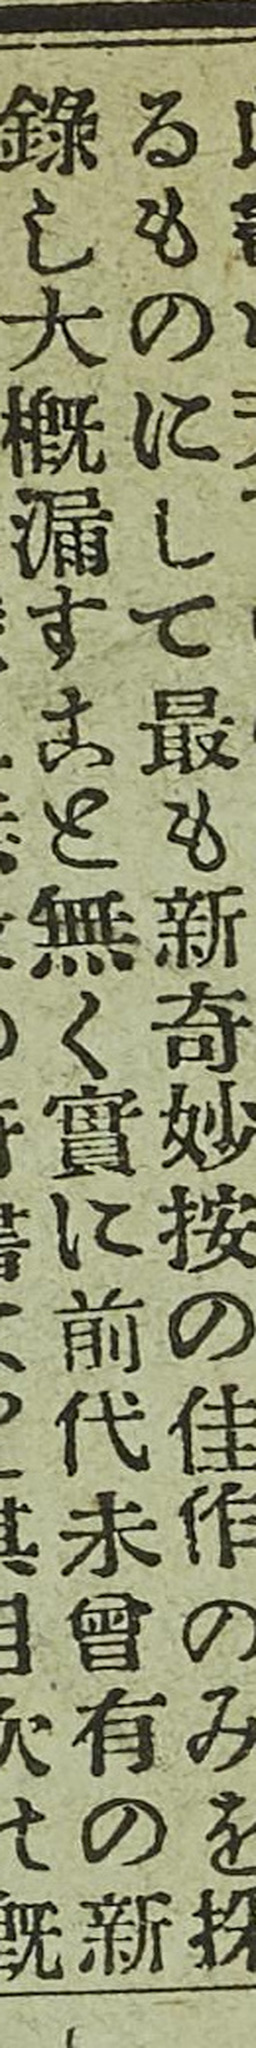録し大概漏らすこと無く実に前代未曾有の新
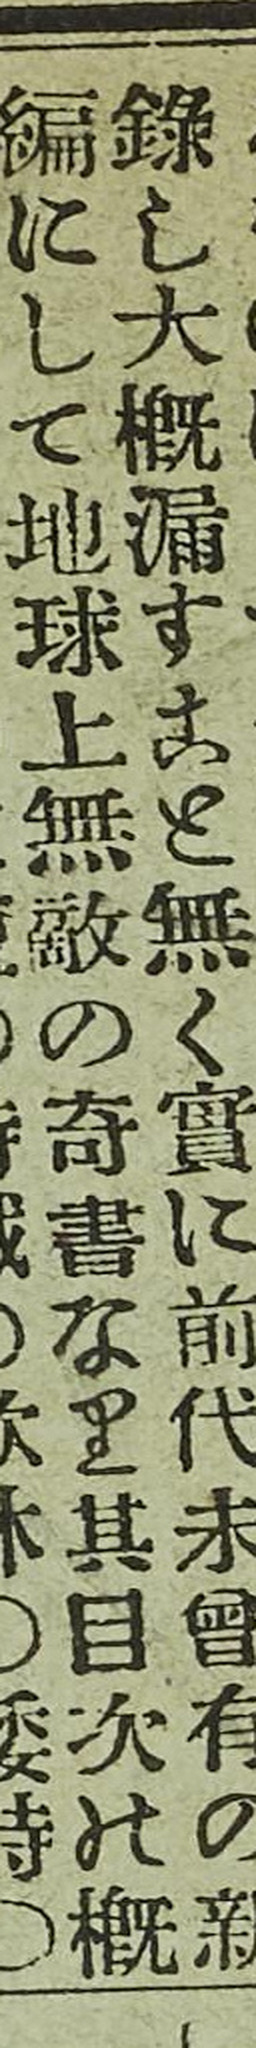編にして地球上無敵の奇書なり其目次の概
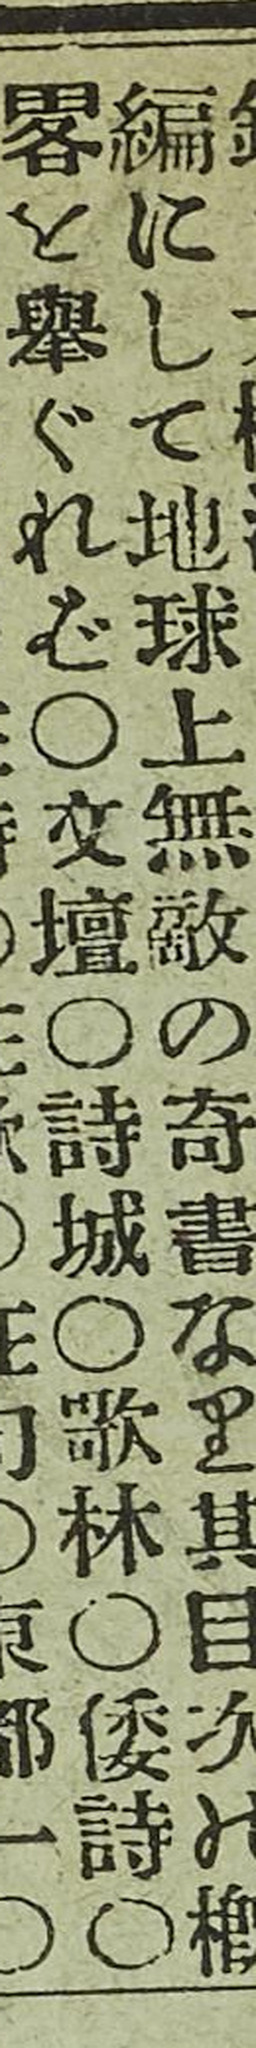略を挙ぐれば○文壇○詩城○歌林○倭詩○
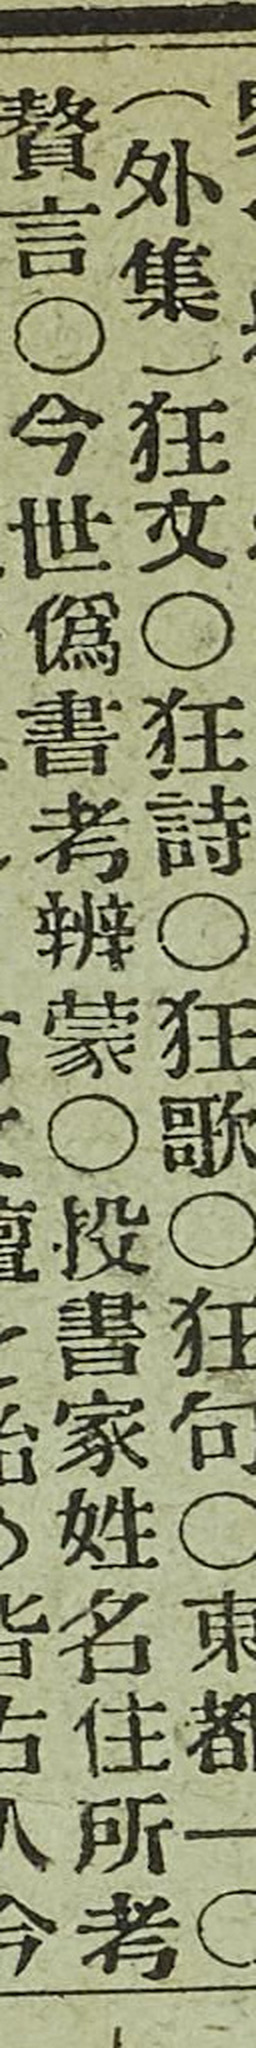贅言○今世偽書考弁蒙○投書家姓名住所考
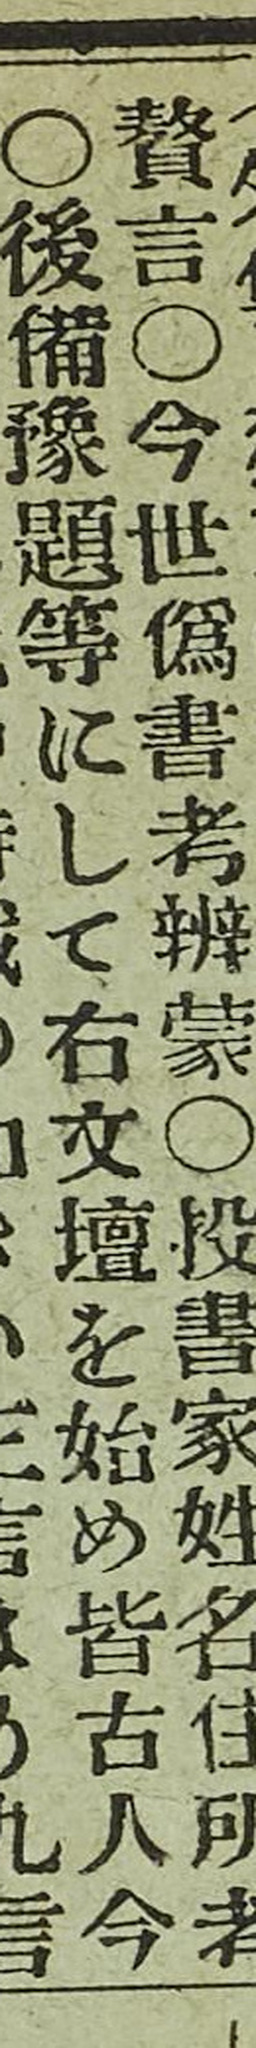○備後豫題等にして右文壇を始め皆古人今
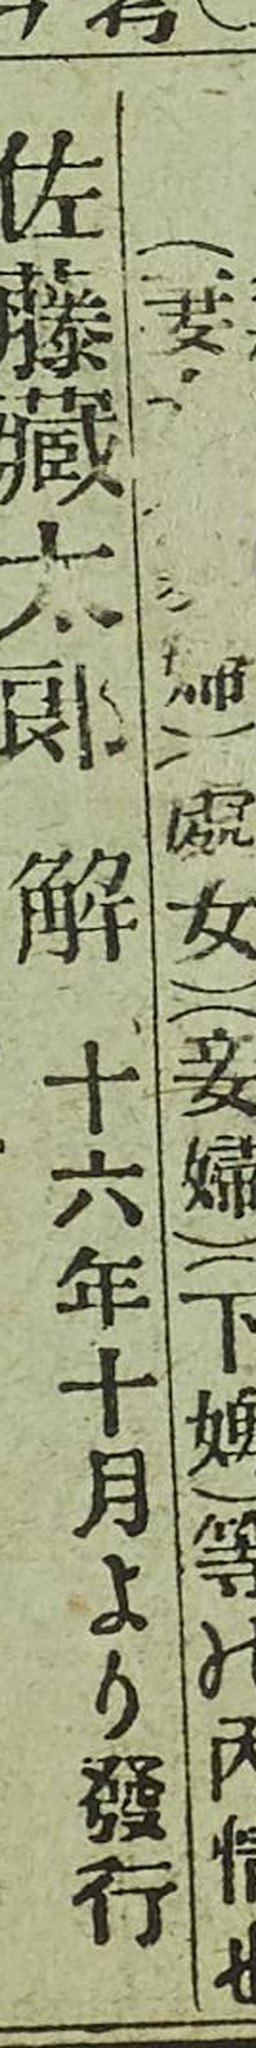佐藤蔵太郎解十六年十月より発行
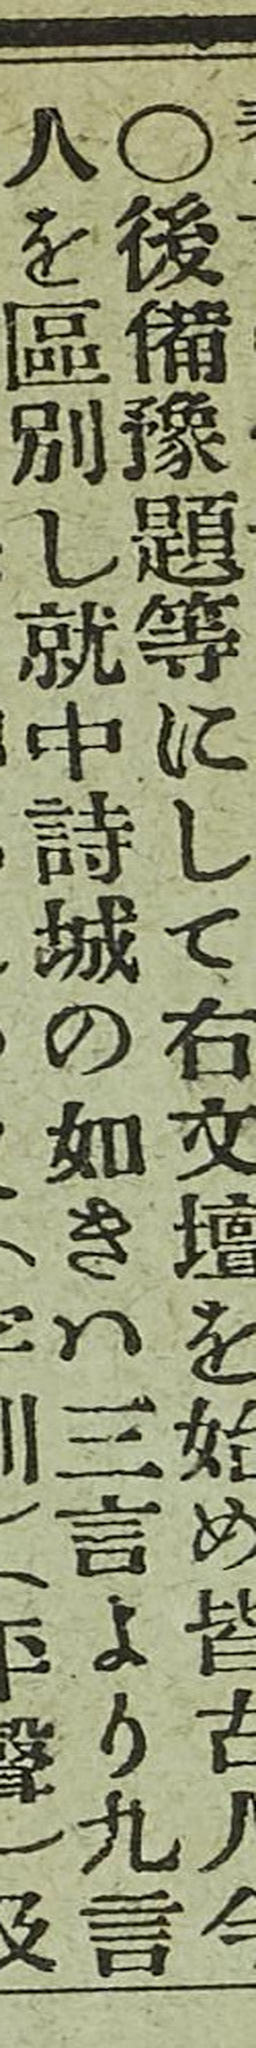人を区別し就中詩城の如きは三言より九言
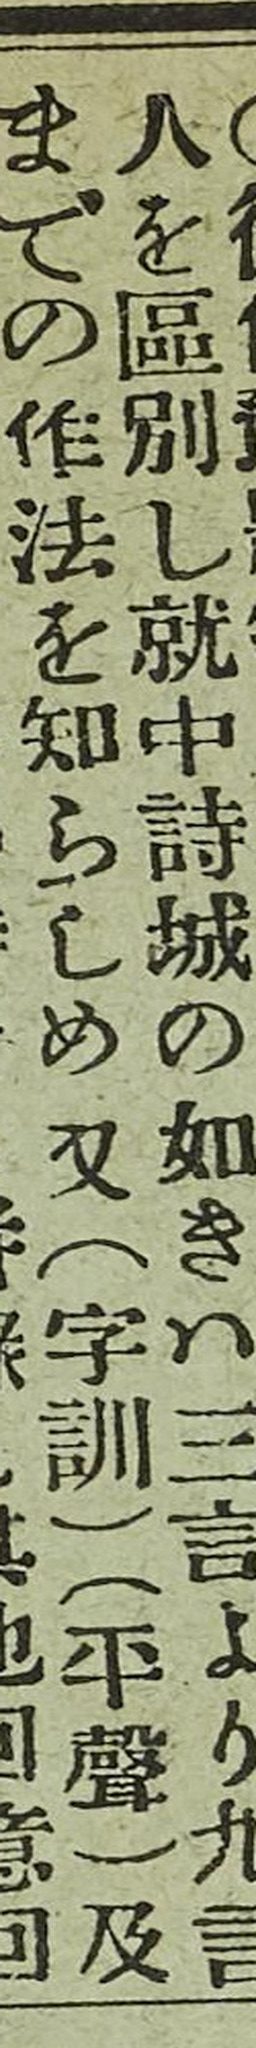までの作法を知らしめ又及
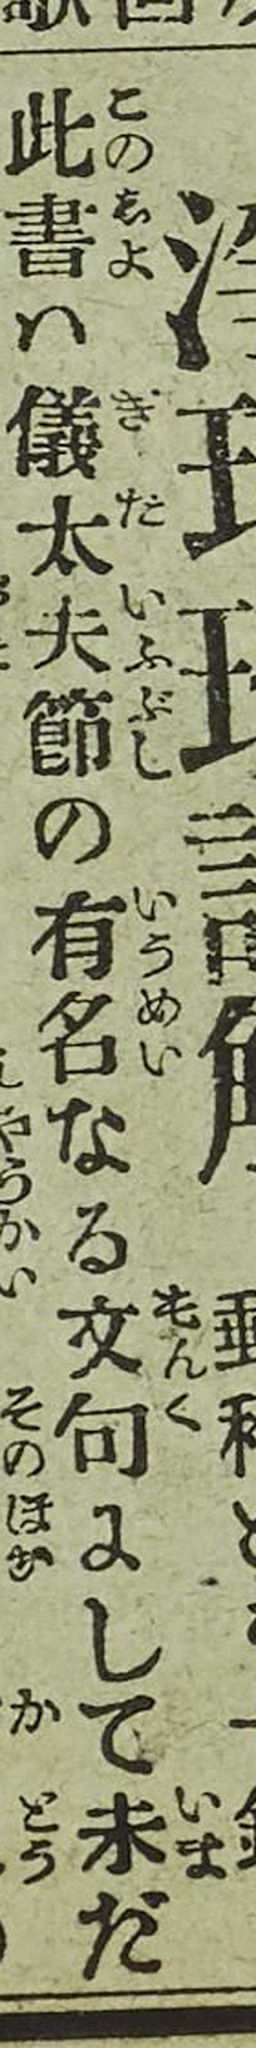此書は義太夫節の有名なる文句にして未だ
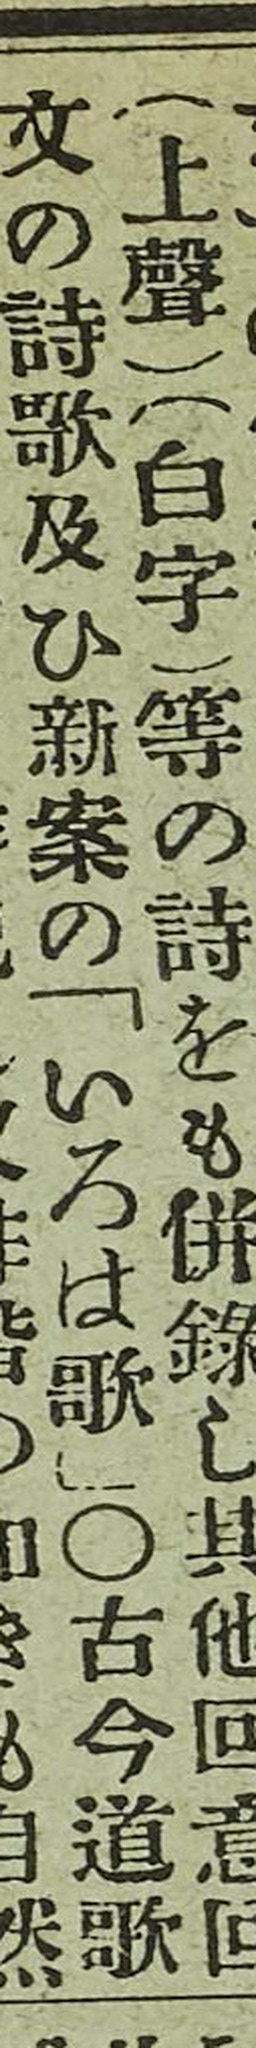文の詩歌及ひ新案の「いろは歌」○古今道歌
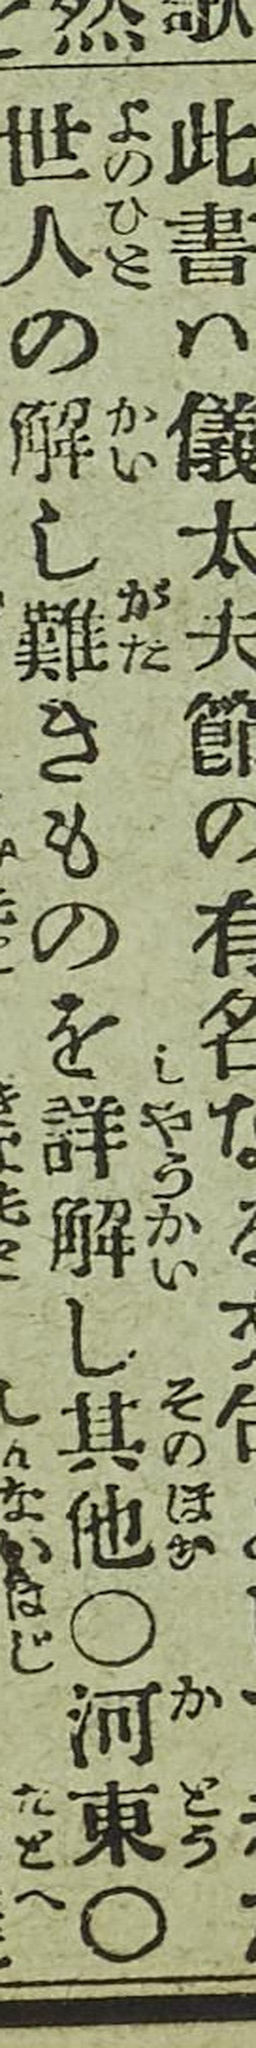世人の解し難きものを詳解し其他○河東○
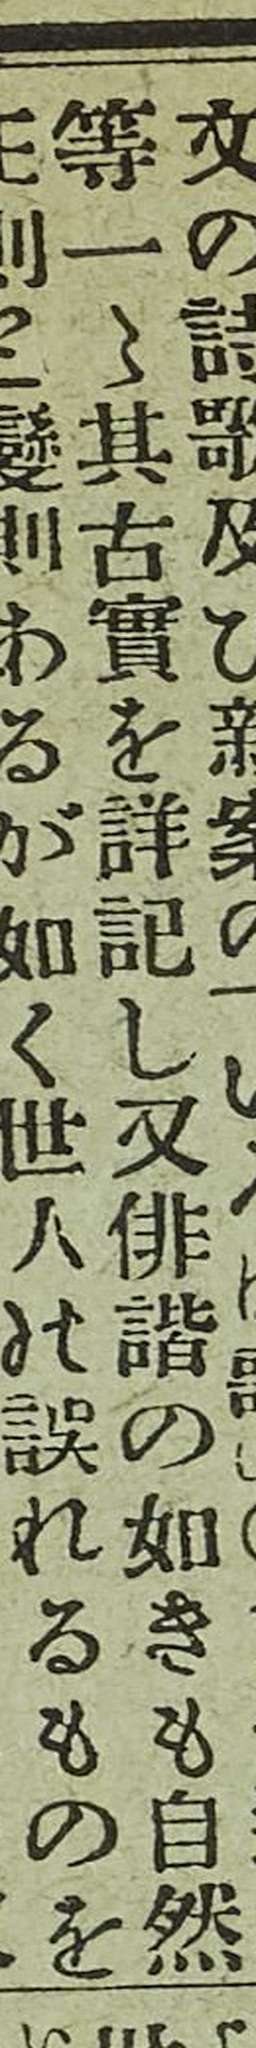等一〻其古実を詳記し又俳諧の如きも自然
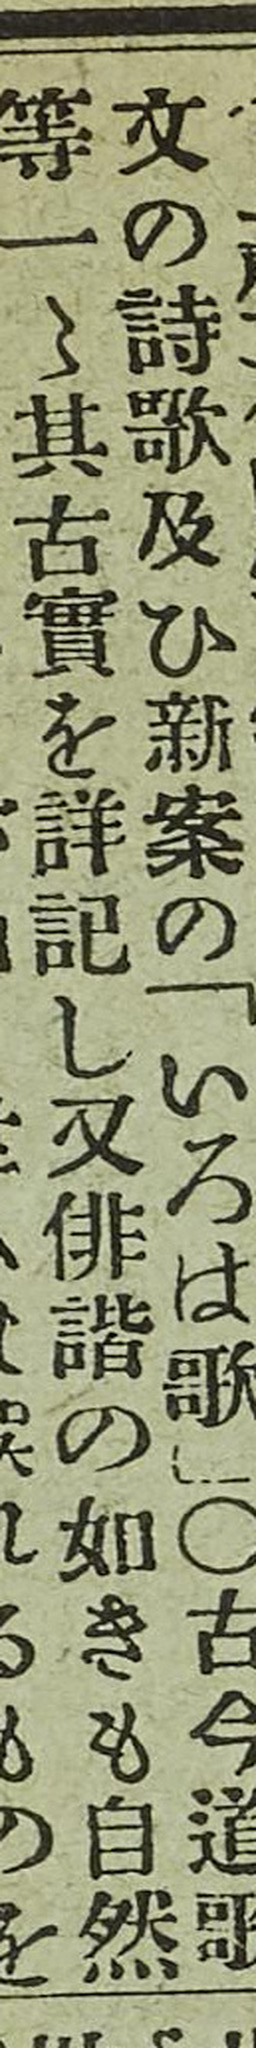等一〻其古実を詳記し又俳諧の如きも自然
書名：永代惨話　文化の夢　全
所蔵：東京大学地震研究所図書室 Earthquake Research Institute Library, The University of Tokyo, JAPAN
